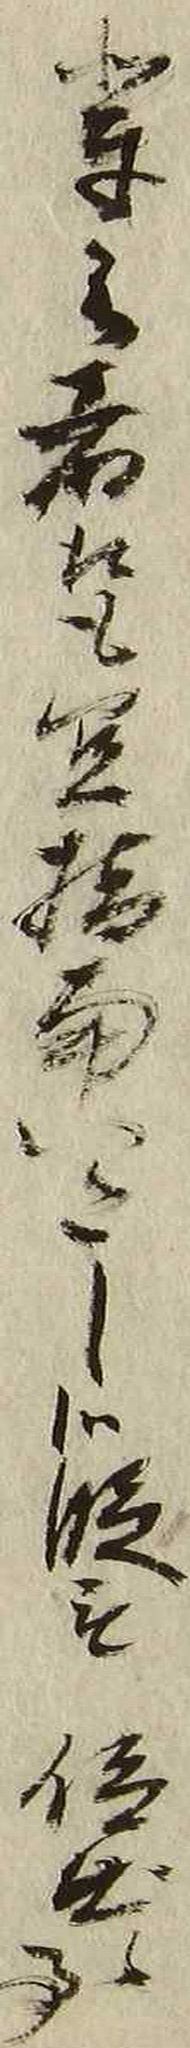輩之者江も宜指南いたし候段被仰出候事
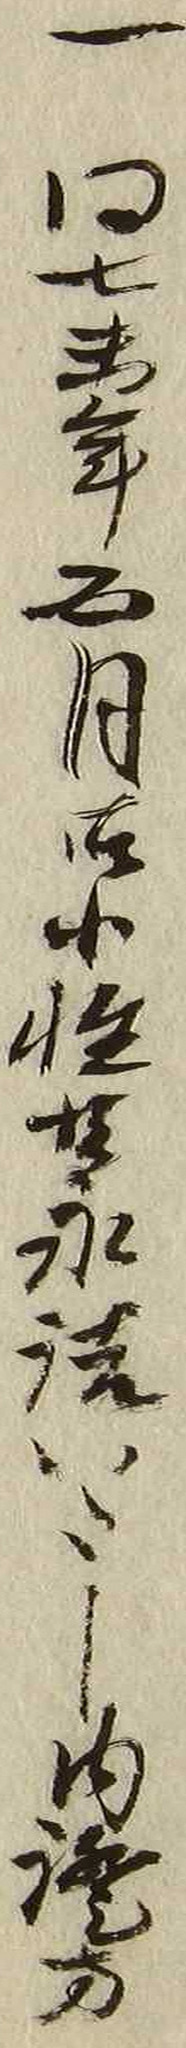一同七未年五月御小性共永詰いたし内証方
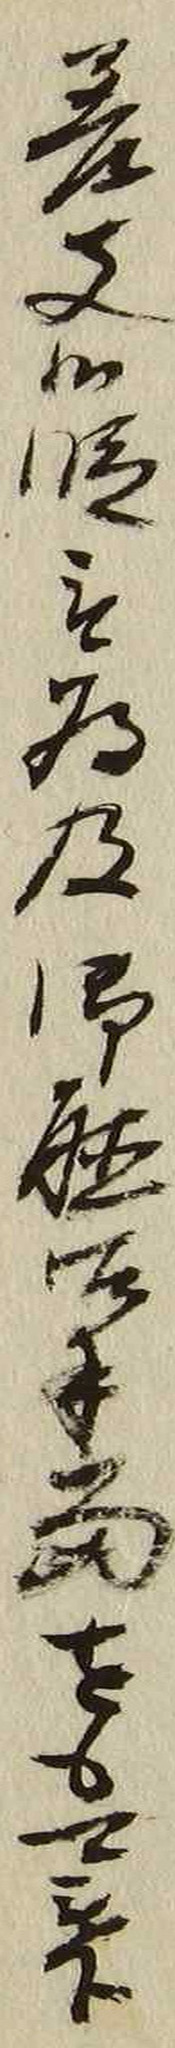差支候段被為及御聴御手当をも可被下
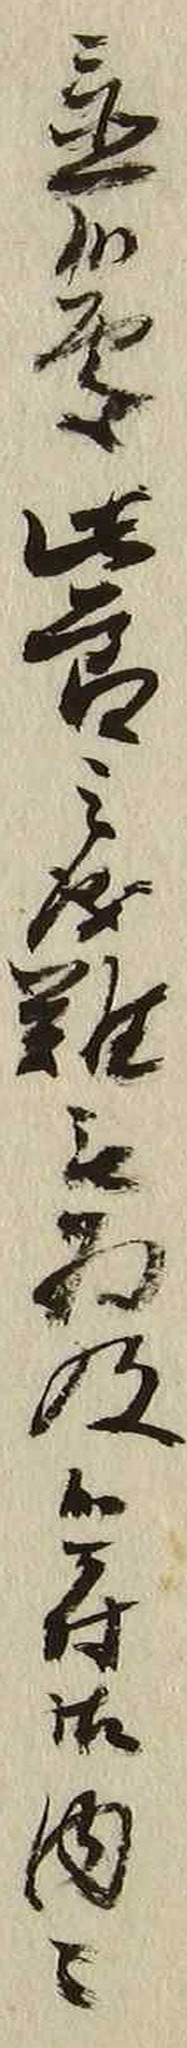置候処此節之儀難被為及候ニ付御内々
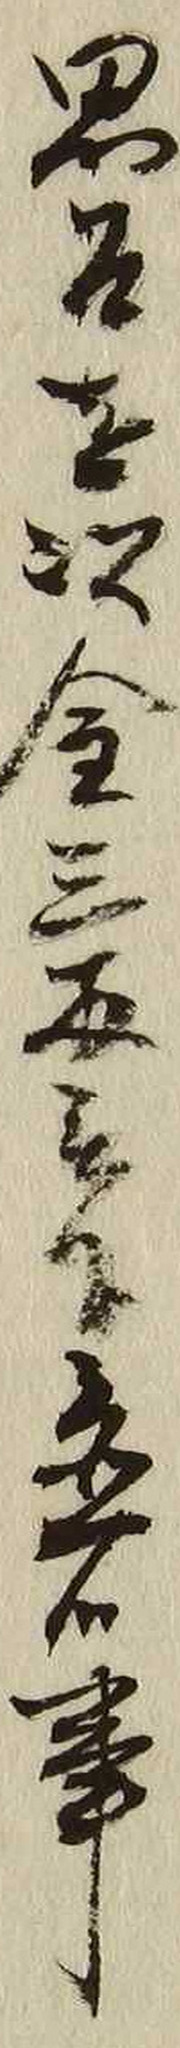思召を以金三両被下置候事
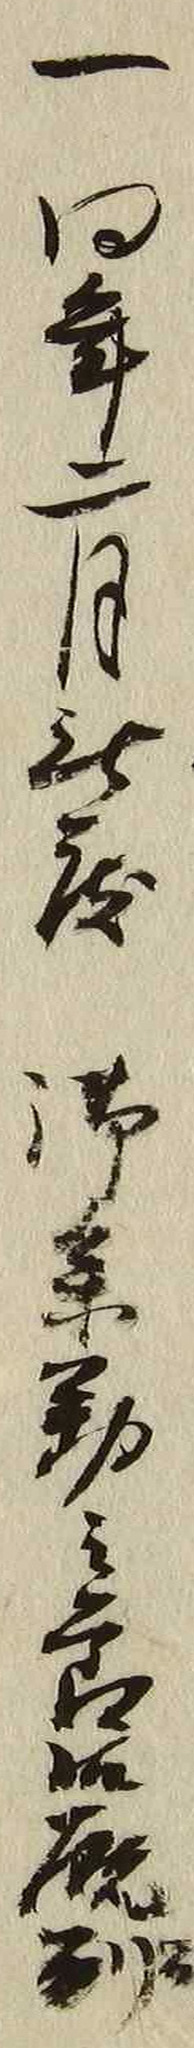一同年二月此度御参勤之節御厩別
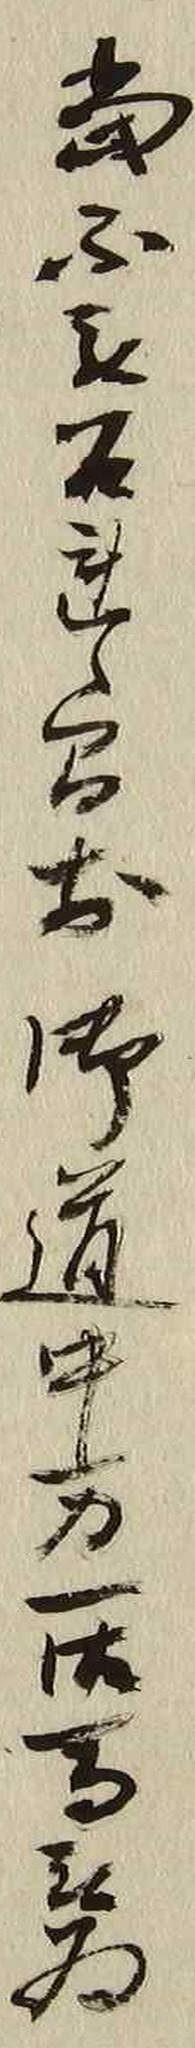当不被召連候間於御道中万一御馬被為
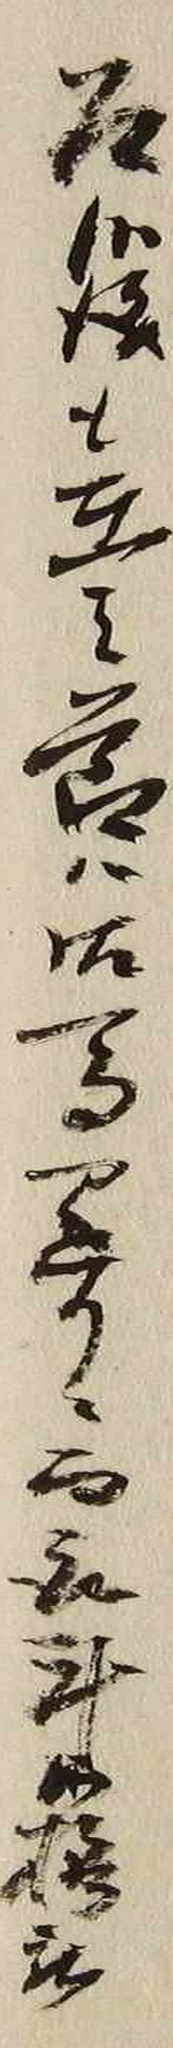召候儀も在之節ハ御馬懸りニ而取計候様被
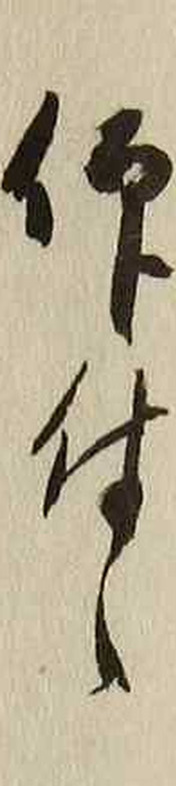仰付候
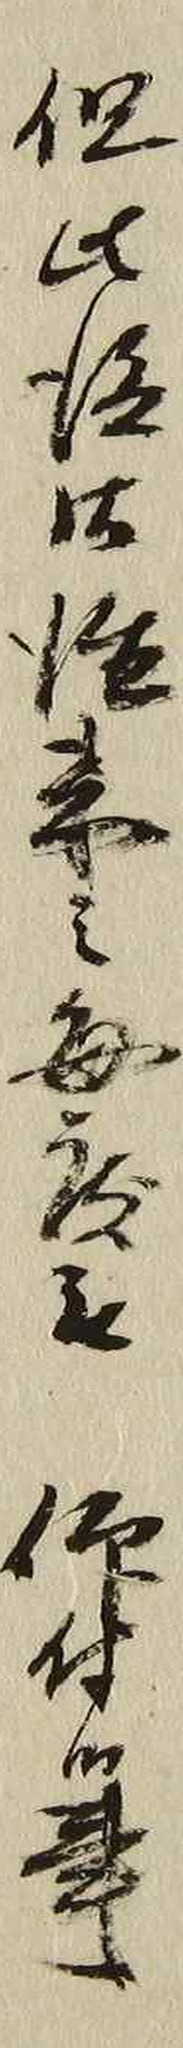但此後御往来之毎度被仰付候事
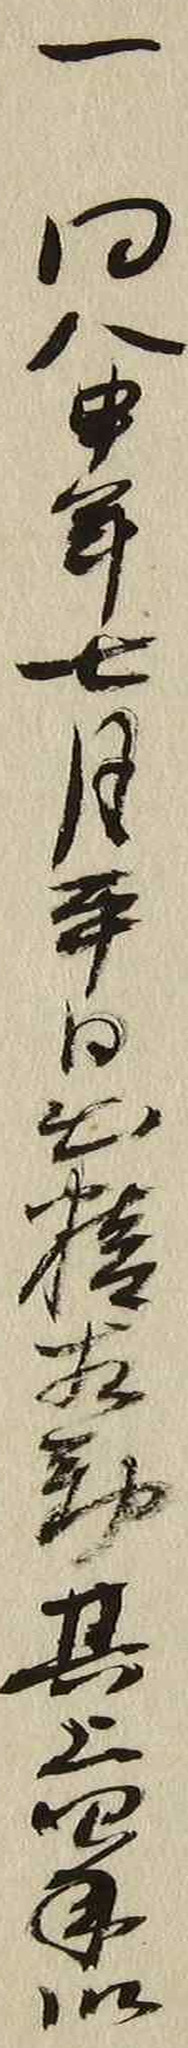一同八申年七月平日出精相勤其上四年以
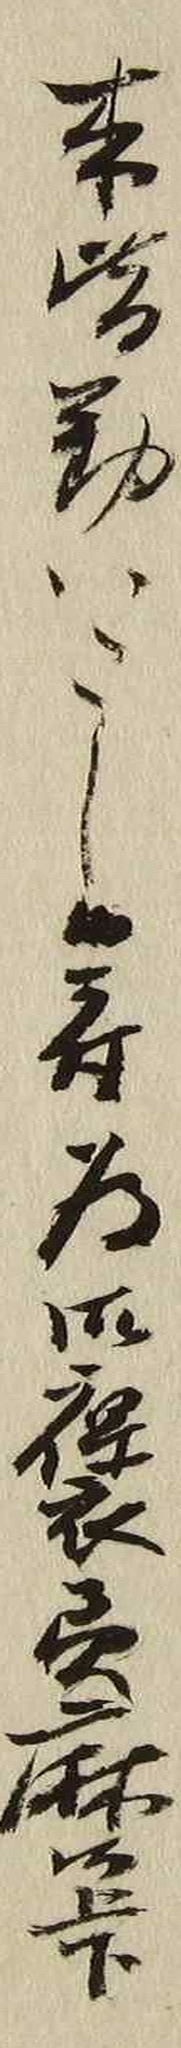来皆勤いたし候ニ付為御褒美麻御上下
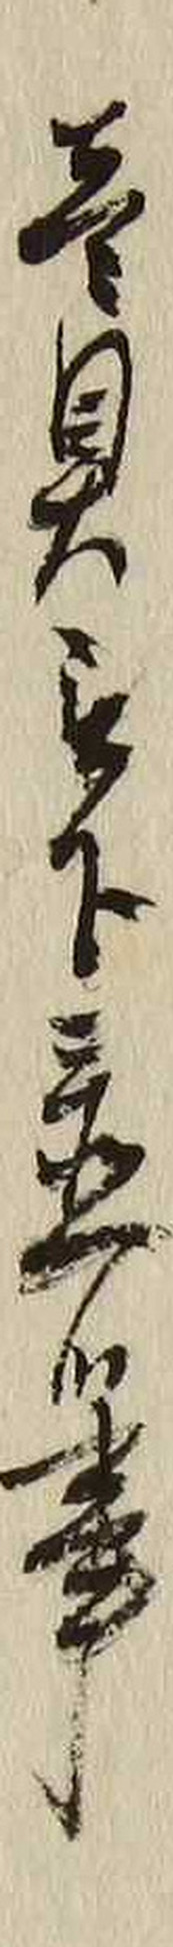壱具被下置候事
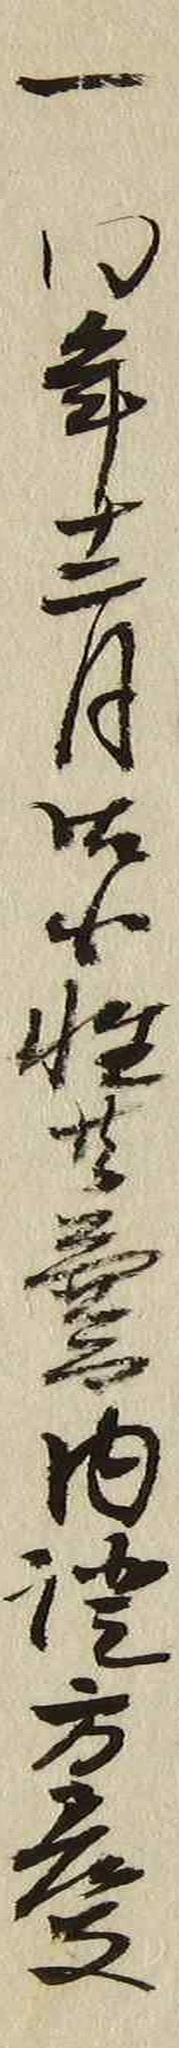一同年十二月御小性共兼而内証方差支
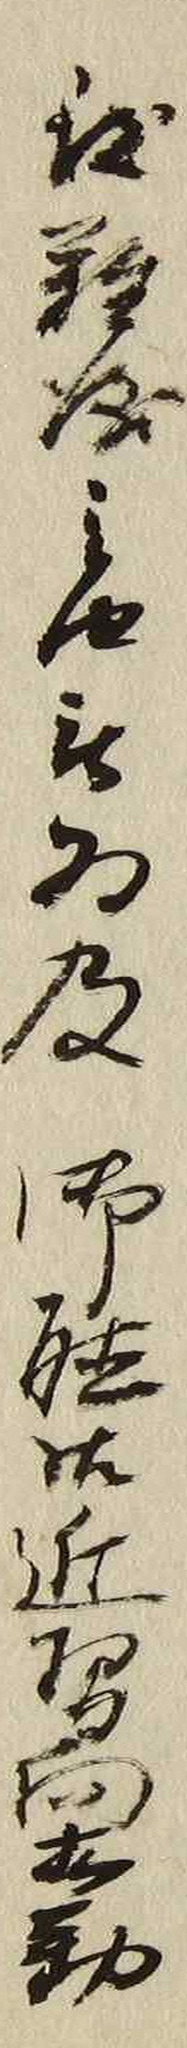致難儀之由被為及御聴御近習向相勤
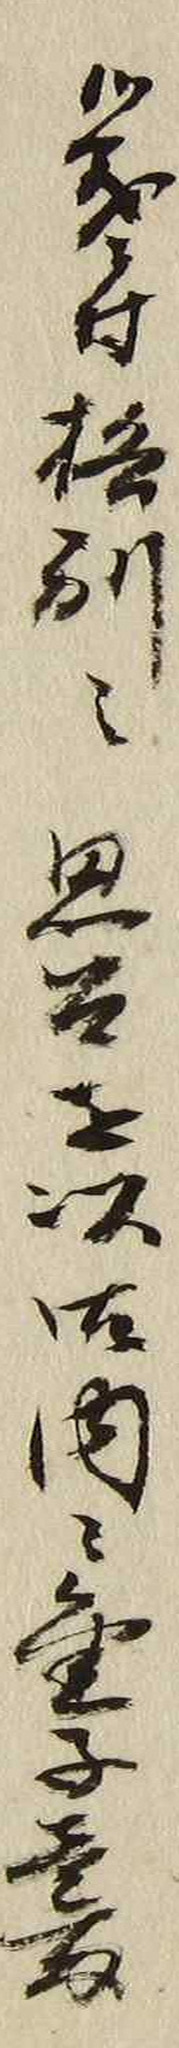候義ニ付格別之思召を以御内々金子壱両
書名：諸士系譜　巻之345　も之部1
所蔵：会津若松市立会津図書館
